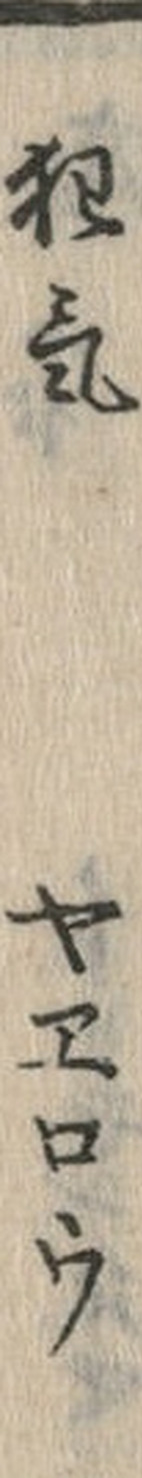狂気ヤヱロウ

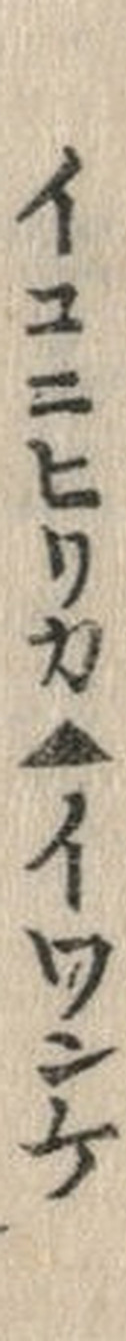イコニヒリカ▲イワンケ
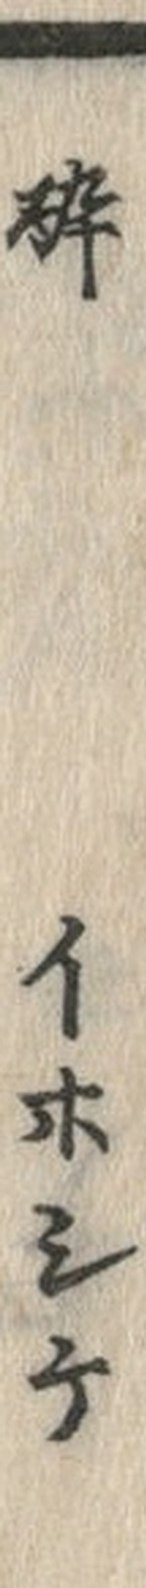酔イホシケ
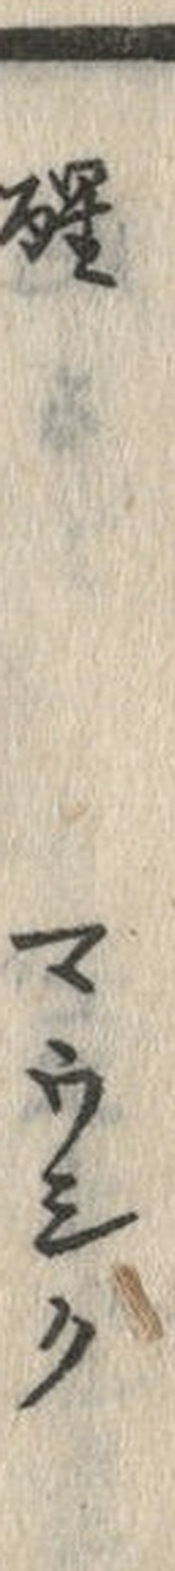醒マウシク
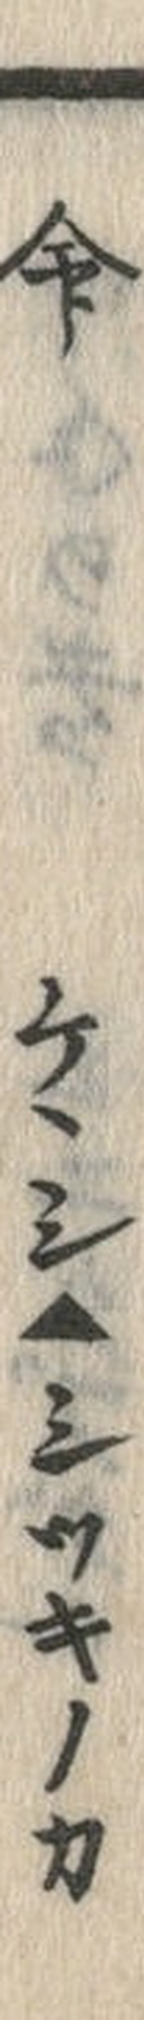命ケヽシ▲シツキノカ

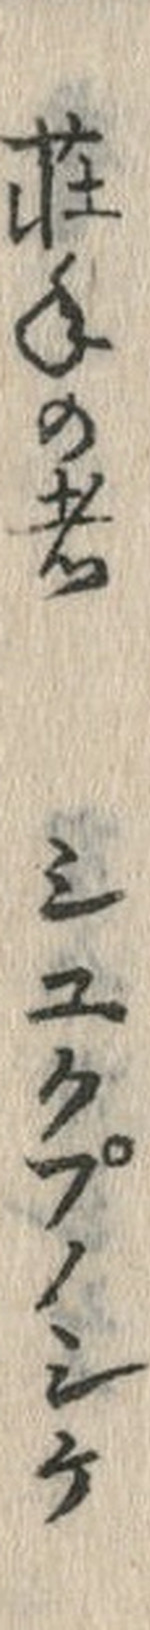壮年の者シユクプノシケ

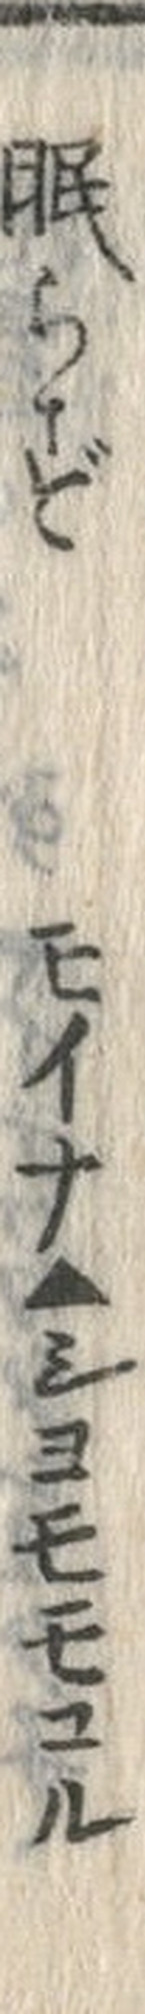眠らずモイナ▲シヨモモコル

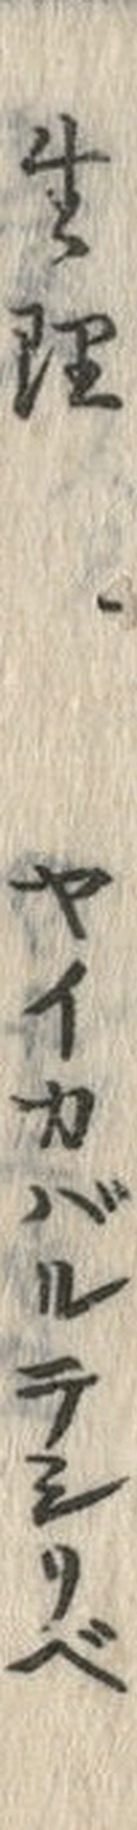生理ヤイカバルテシリベ
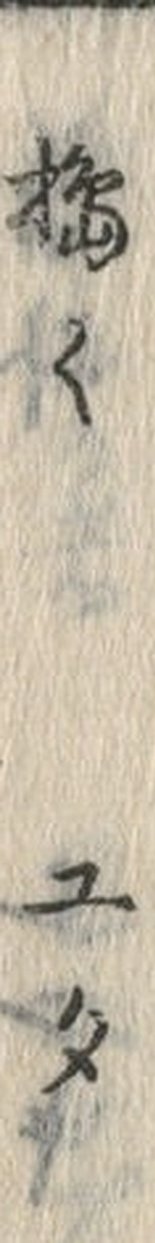搗くユタ
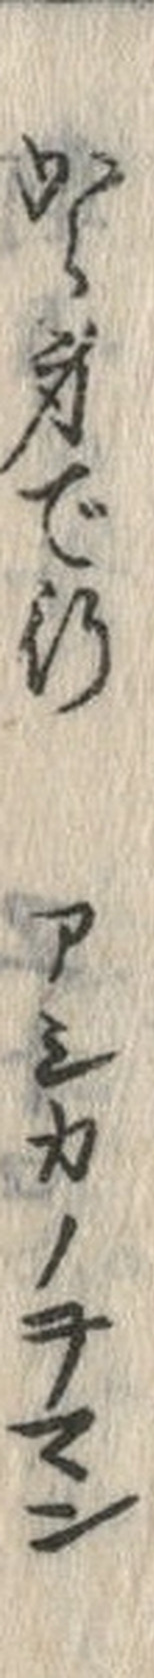から身で行アシカノヲマン
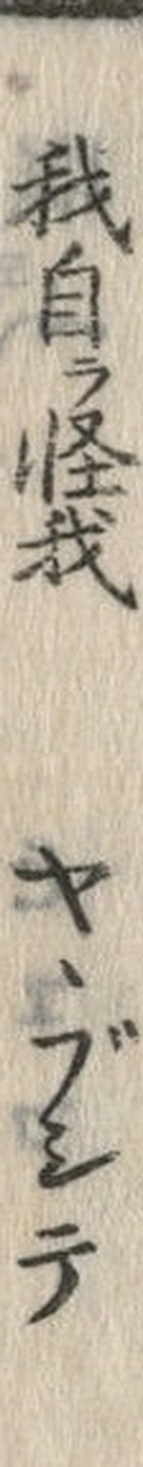我自怪我ヤヽブシテ
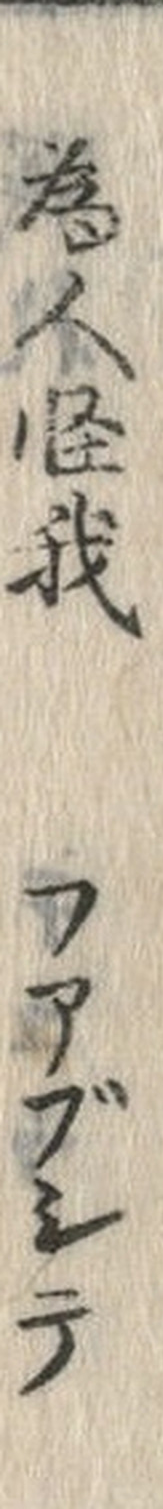為人怪我フアブシテ
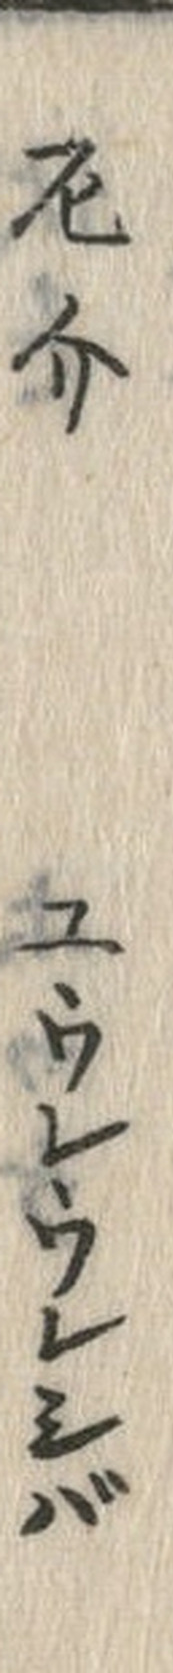厄介ユウレウレシバ
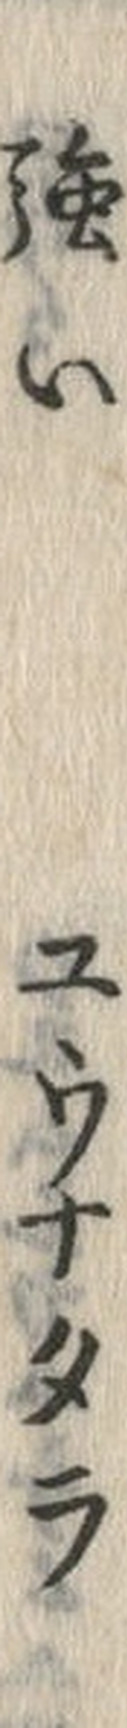強いユウナタラ

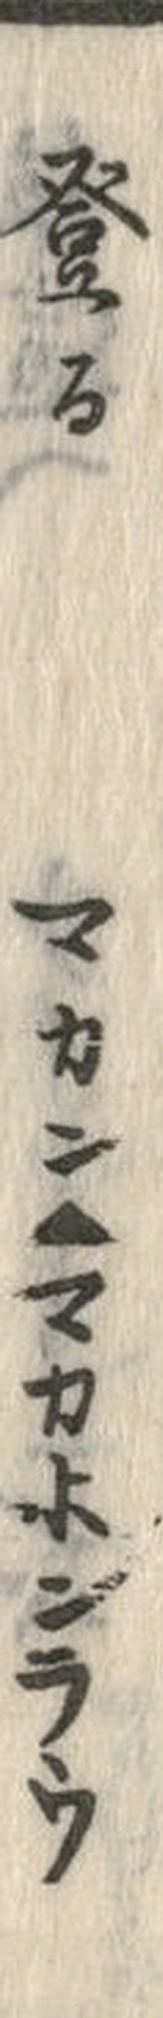登るマカン▲マカホンラウ
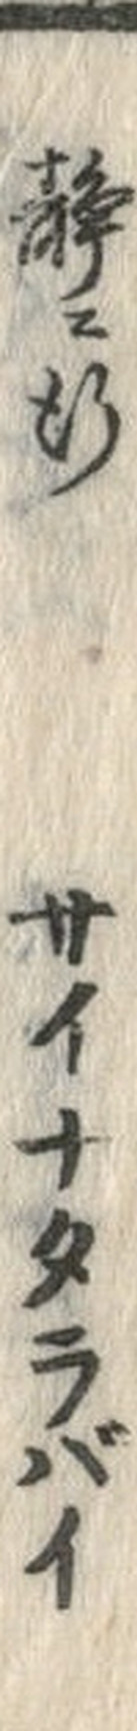静に行サイナタラバイ
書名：蝦夷方言藻汐草　乾巻
